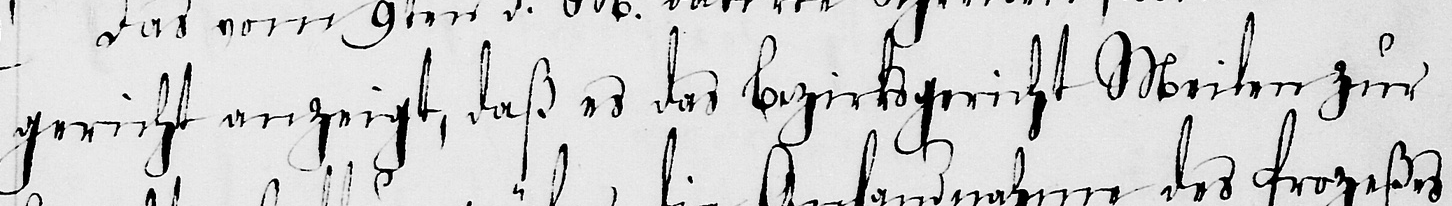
gericht anzeigt, daß es das Bezirksgericht Meilen zur
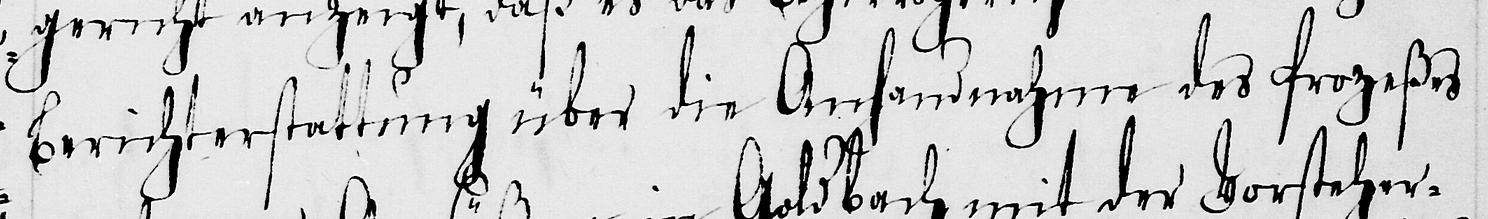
Berichterstattung über die Anhandnahme des Prozeßes
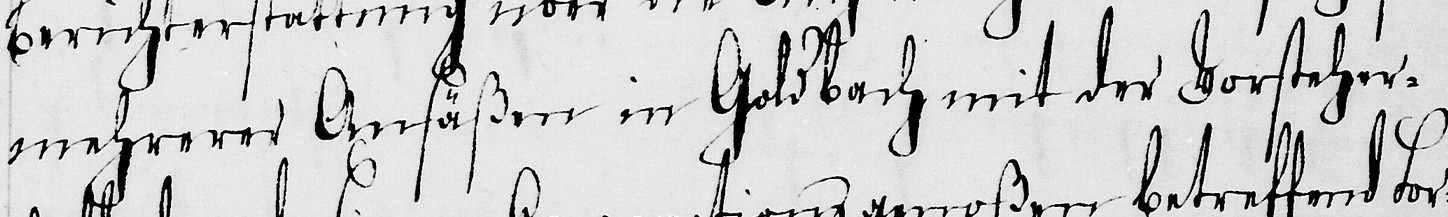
mehrerer Ansäßen in Goldbach mit der Vorsteher¬
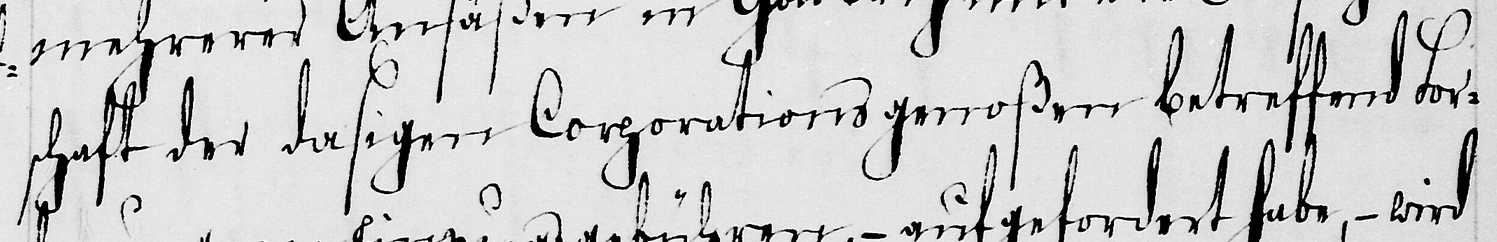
schaft der dasigen Corporationsgenoßen betreffend For¬
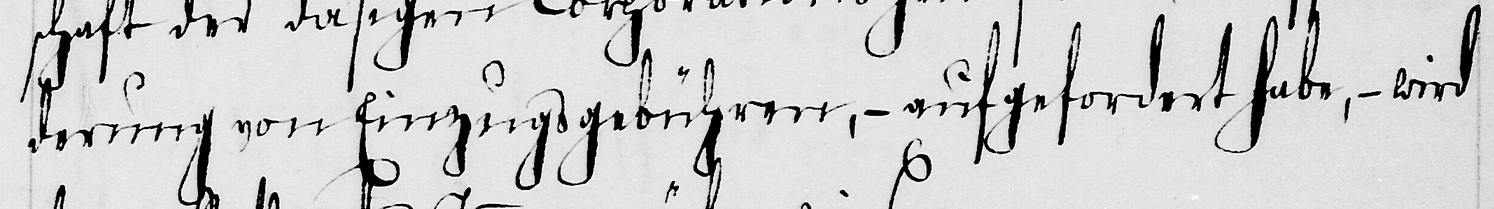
derung von Einzugsgebühren, – aufgefordert habe, – wird
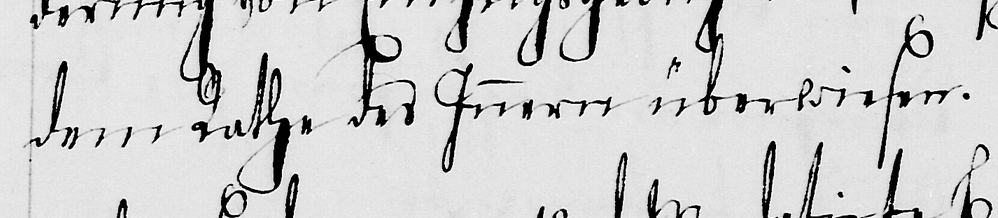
dem Rathe des Innern überwiesen.
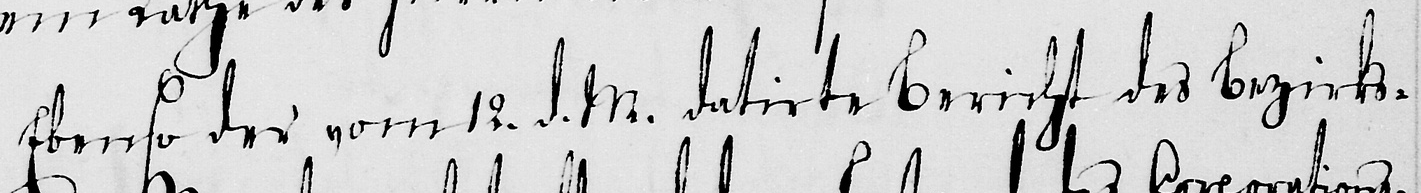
Ebenso der vom 12. d. M. datirte Bericht des Bezirks¬
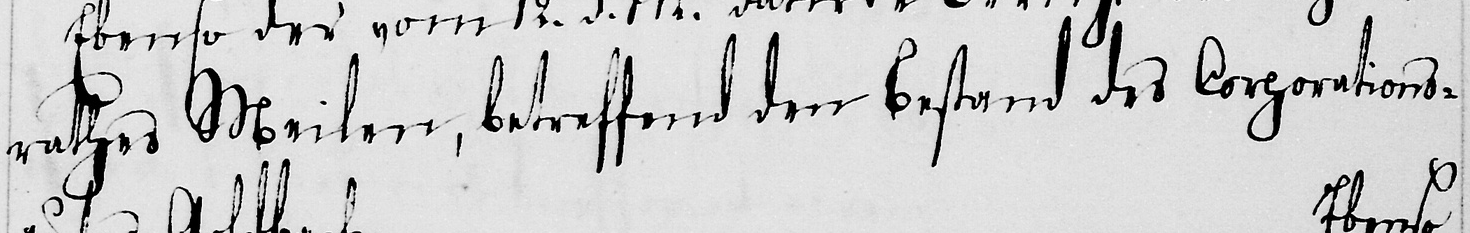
rathes Meilen, betreffend den Bestand des Corporation¬
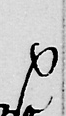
s¬
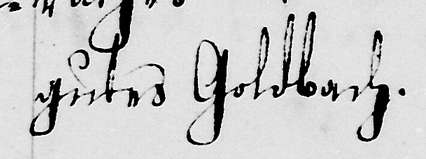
gutes Goldbach.
